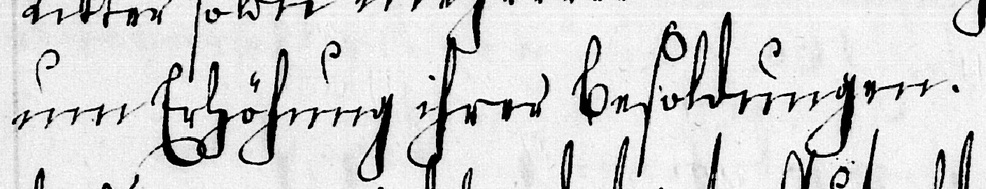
um Erhöhung ihrer Besoldungen.
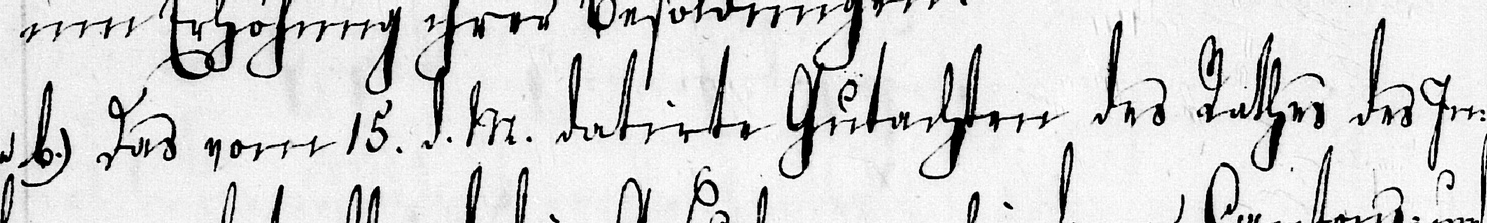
b.) Das vom 15. d. M. datirte Gutachten des Rathes des I¬
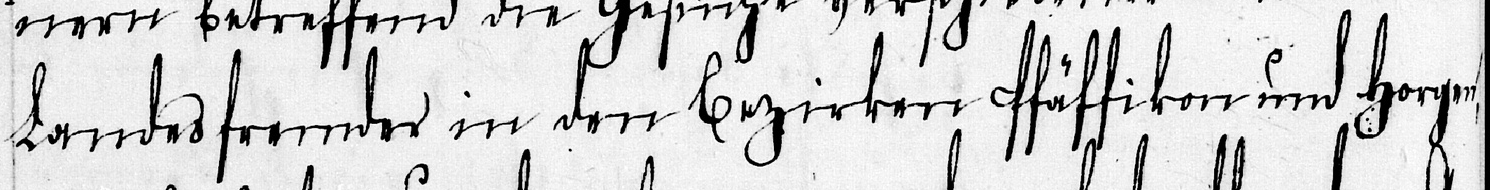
Landesfremder in den Bezirken Pfäffikon und Horgen
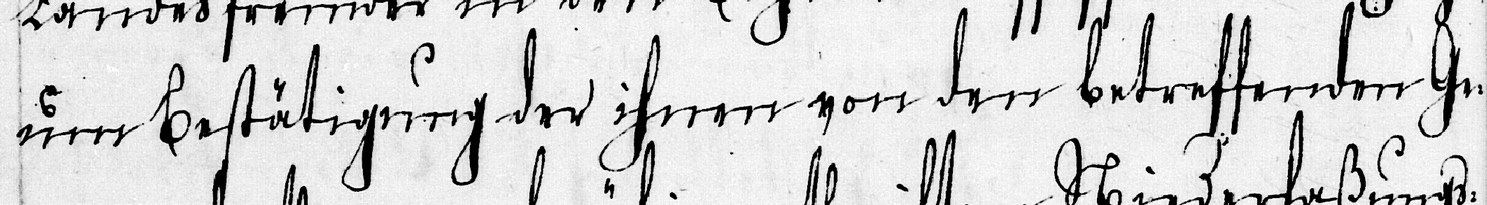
um Bestätigung der ihnen von den betreffenden Ge¬
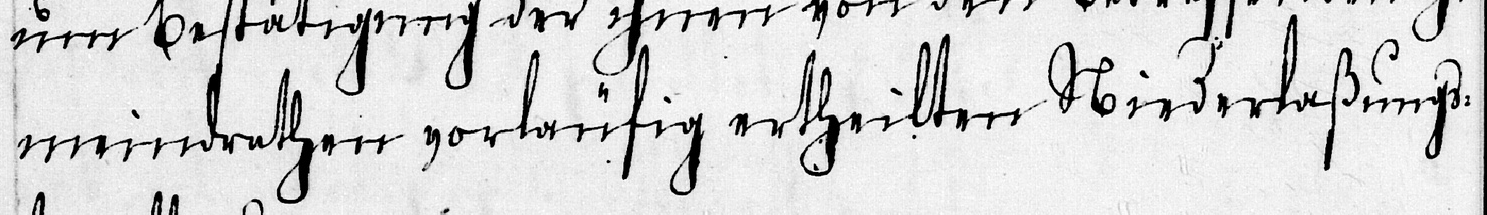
meindrathen vorläufig ertheilten Niederlaßungs¬
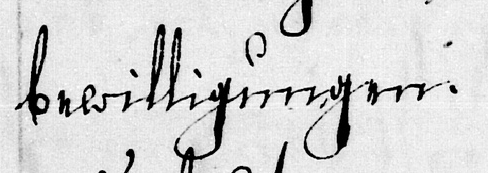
bewilligungen.
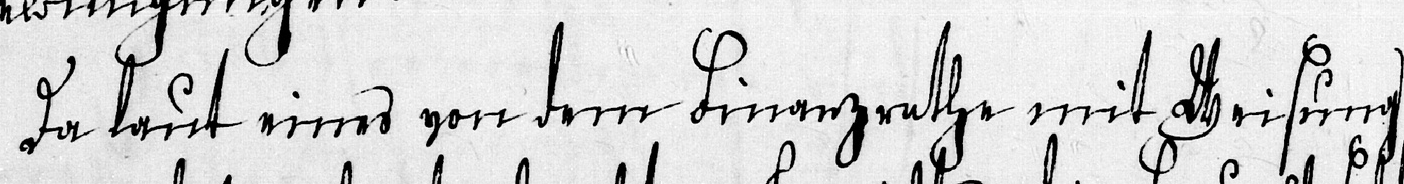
Da laut eines von dem Finanzrathe mit Weisung
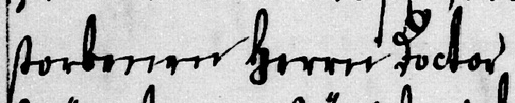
storbenen Herrn Doctor
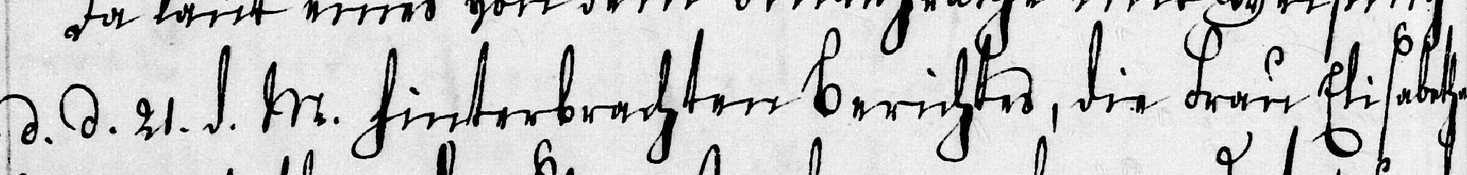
d. d. 21. d. M. hinterbrachten Berichtes, die Frau Elisabet¬
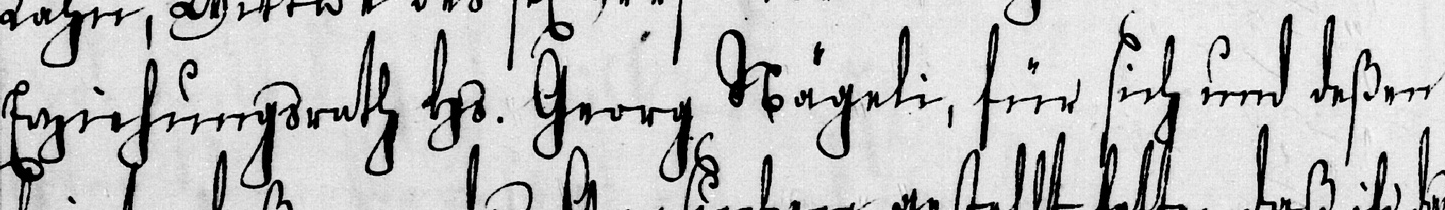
Erziehungsrath Hs. Georg Nägeli, für sich und deßen
